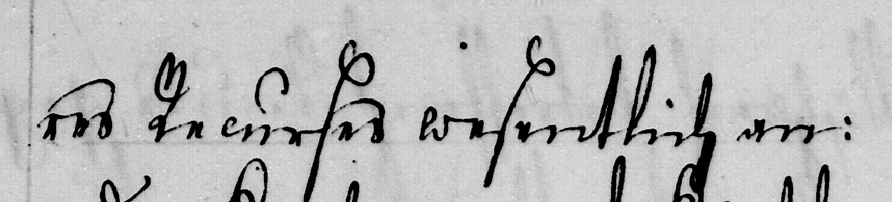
es Recurses wesentlich an:
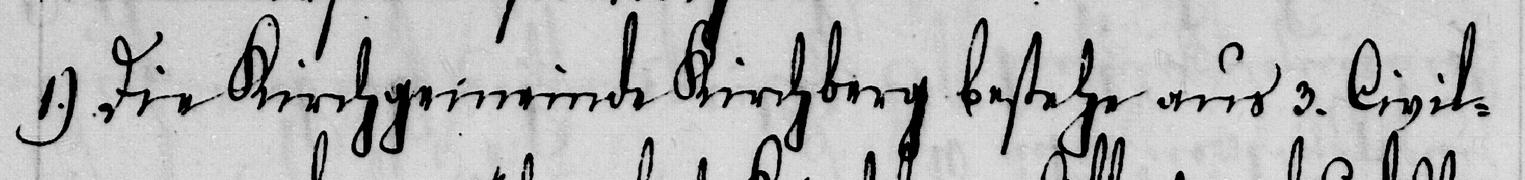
1.) Die Kirchgemeinde Kirchberg bestehe aus 3. Civil¬
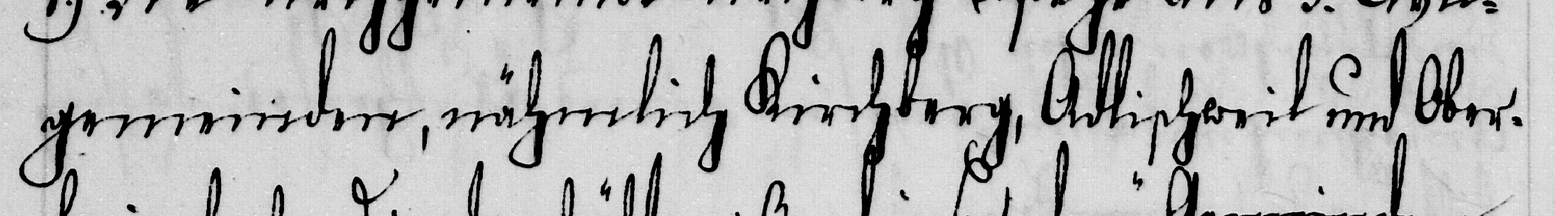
gemeinden, nähmlich Kirchberg, Adlischweil und Obe¬
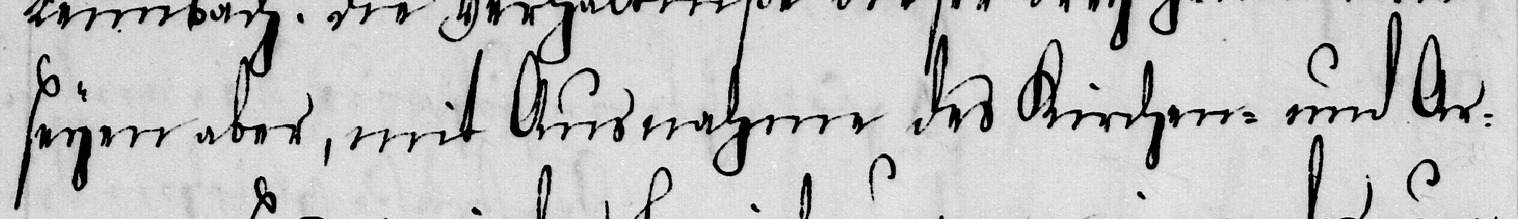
seyen aber, mit Ausnahme des Kirchen- und Ar¬
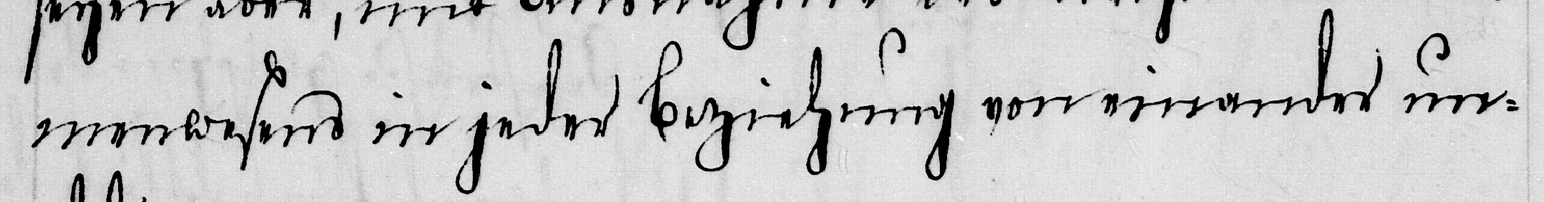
menwesens in jeder Beziehung von einander un¬
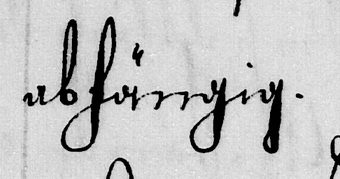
abhängig.
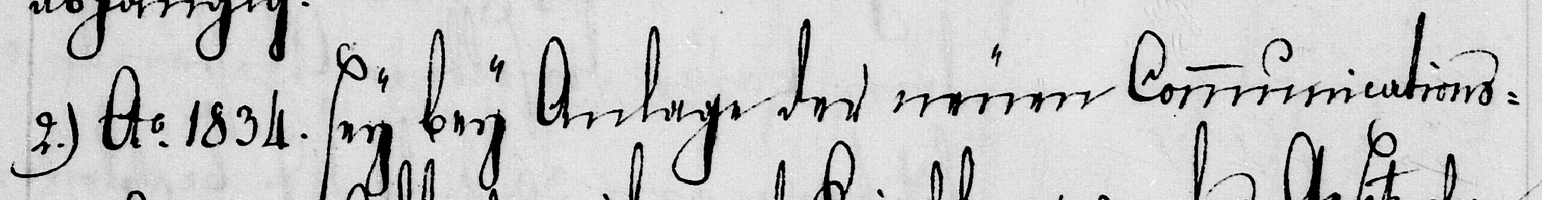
2.) Ao. 1834. sey bey Anlage der neuen Communications¬
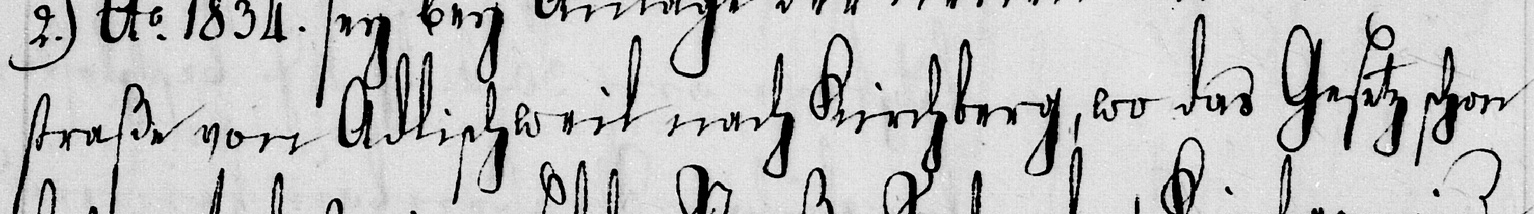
straße von Adlischweil nach Kirchberg, wo das Gesetz schon
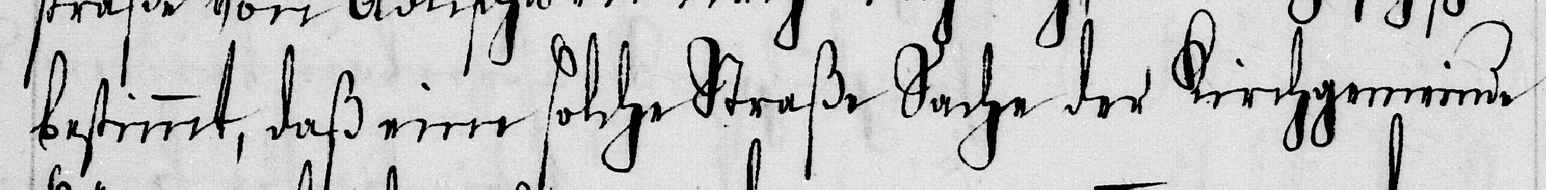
bestimmt, daß eine solche Straße Sache der Kirchgemeinde
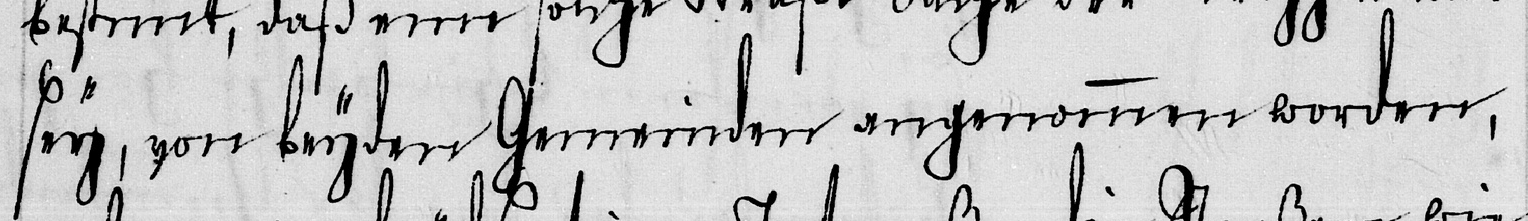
sey, von beyden Gemeinden angenommen worden,
